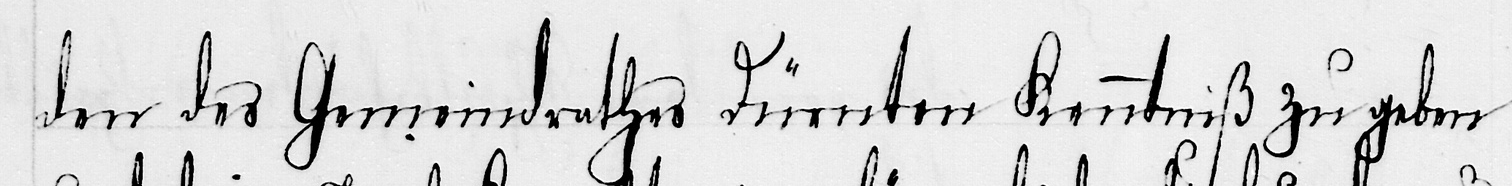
den des Gemeindrathes Dürnten Kenntniß zu geben
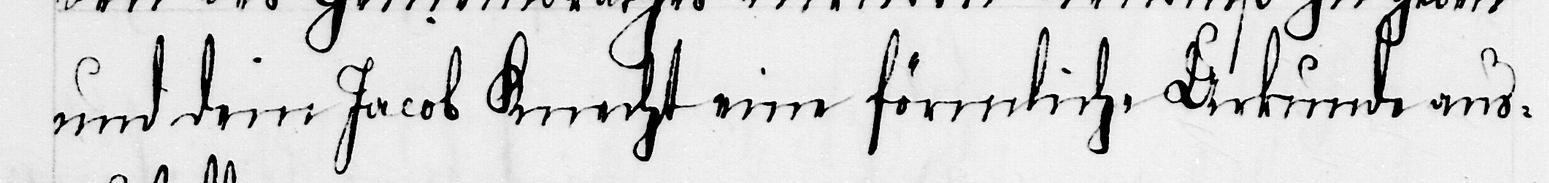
und dem Jacob Knecht eine förmliche Urkunde aus¬
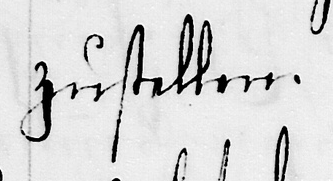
zustellen.
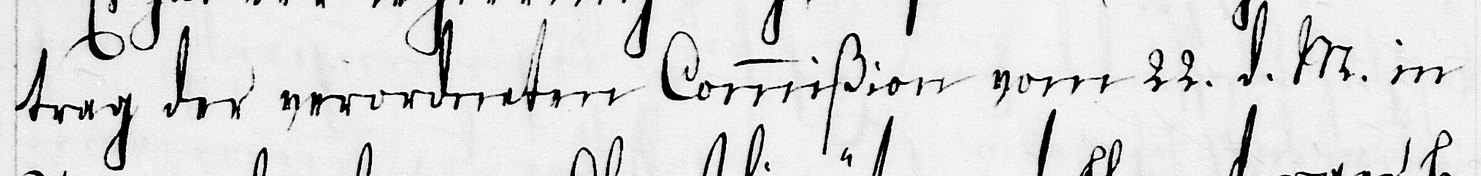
trag der verordneten Commißion vom 22. d. M. in
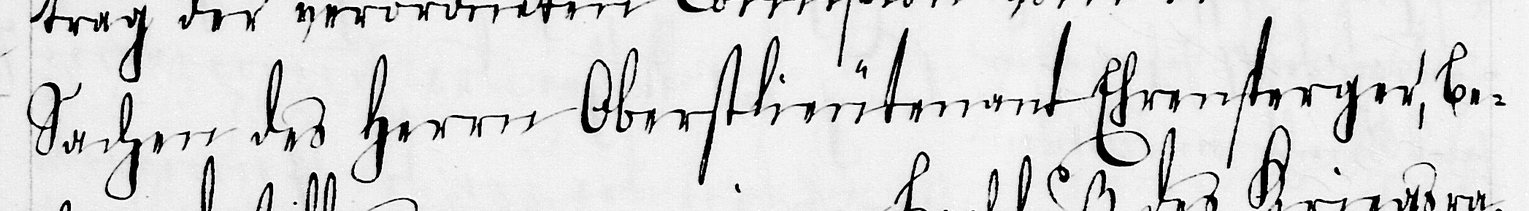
Sachen des Herrn Oberstlieutenant Ehrensperger, Be¬
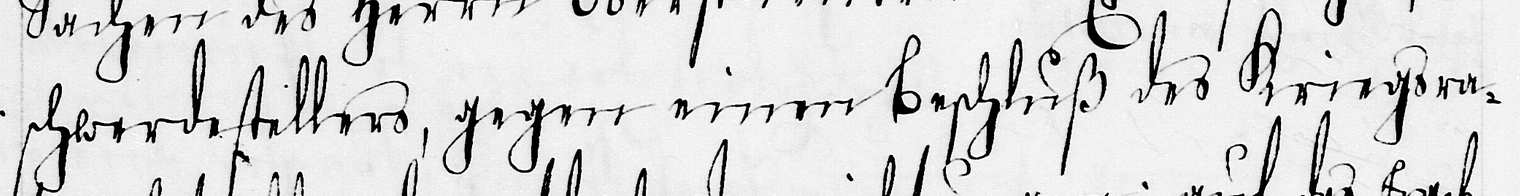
schwerdestellers, gegen einen Beschluß des Kriegsra¬
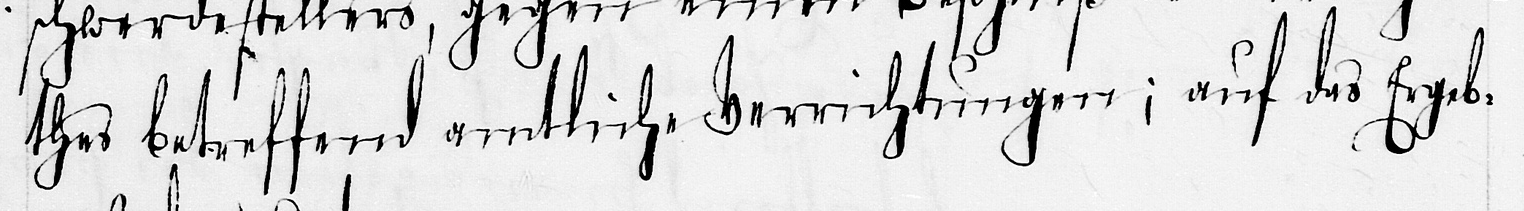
thes betreffend amtliche Verrichtungen; auf das Erge¬
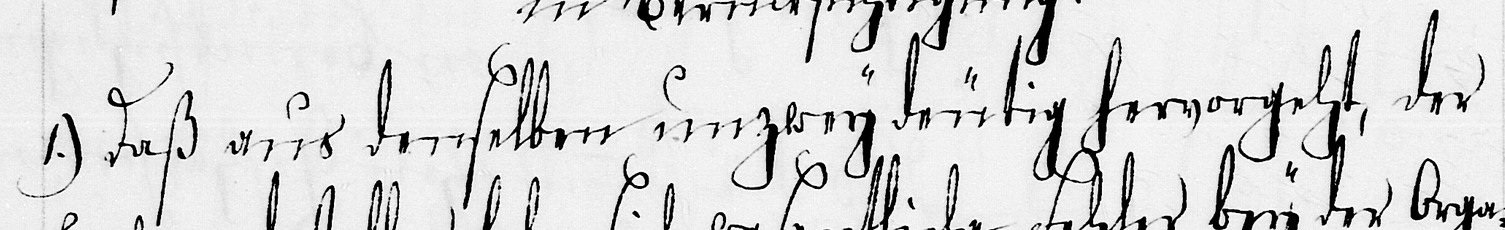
1.) Daß aus denselben unzweydeutig hervorgeht, der
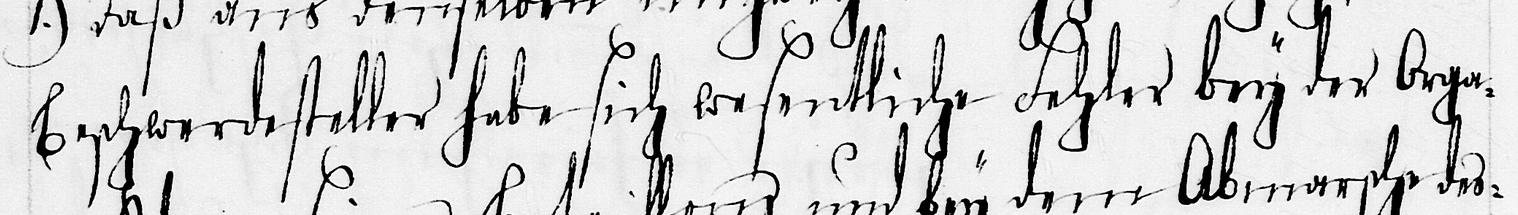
Beschwerdesteller habe sich wesentliche Fehler bey der Orga¬
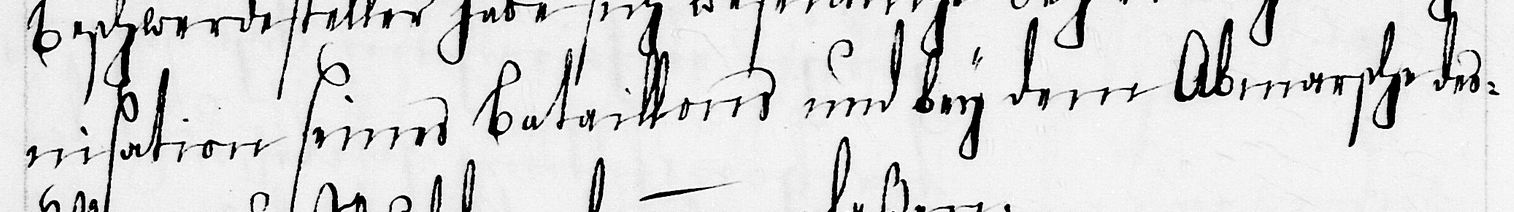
nisation seines Bataillons und bey dem Abmarsche de¬
